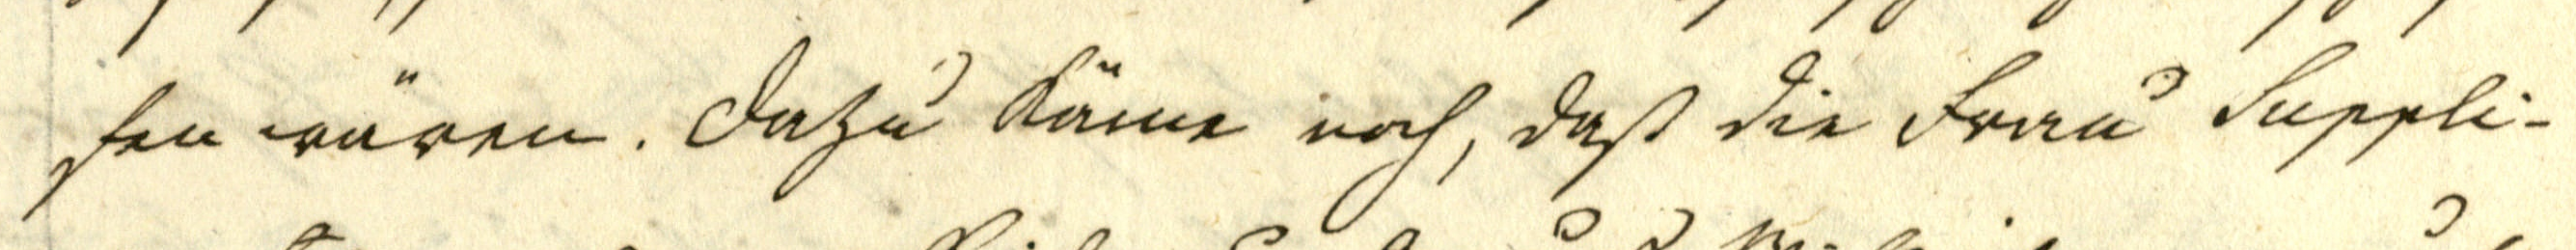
fen wären. Dazu käme noch, daß die Frau Suppli¬
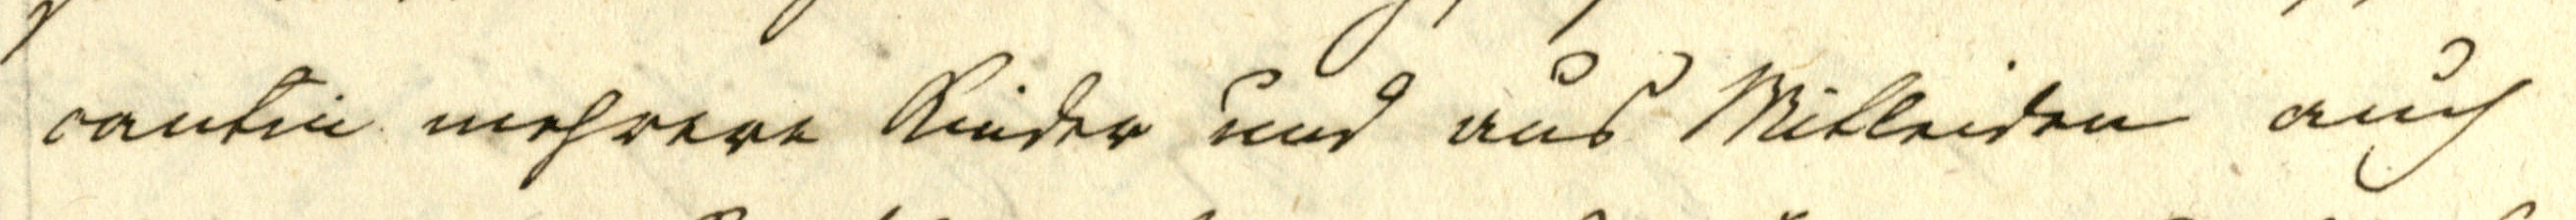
cantin mehrere Kinder und aus Mitleiden auch
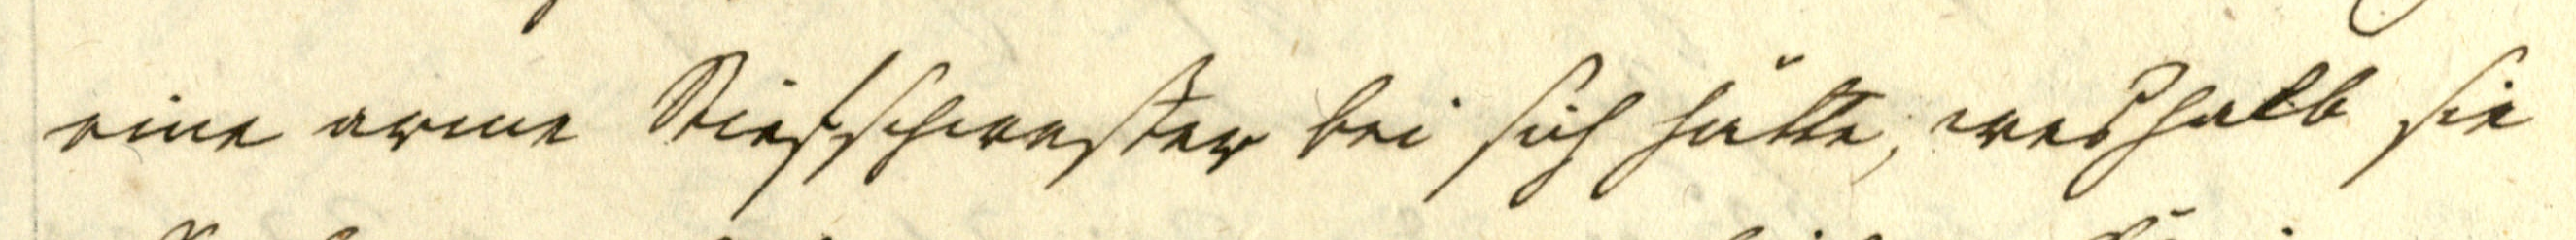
eine arme Stiefschwester bei sich hätte, weshalb sie
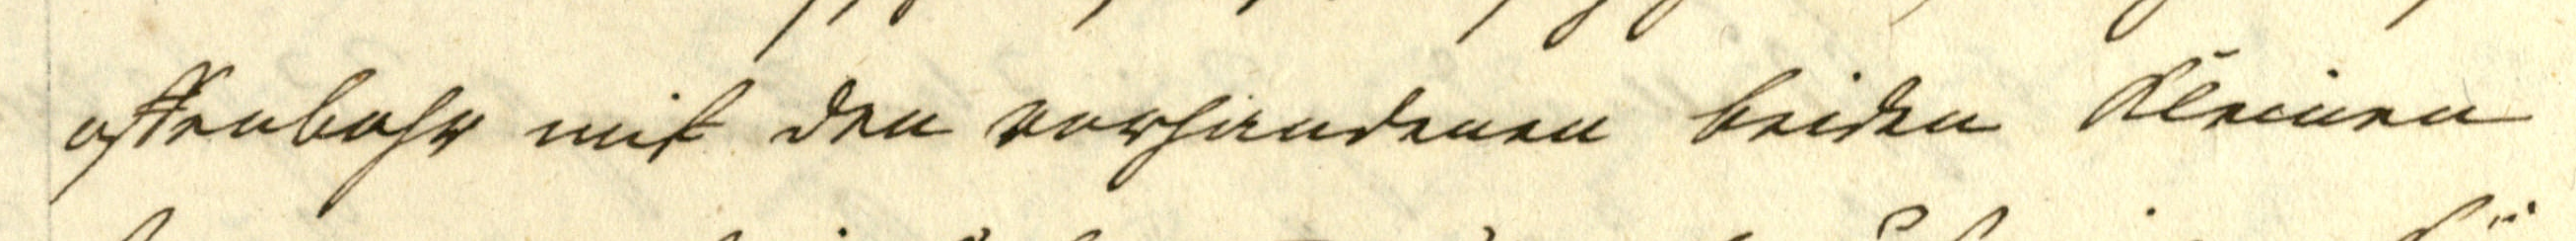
offenbahr mit den vorhandenen beiden kleinen
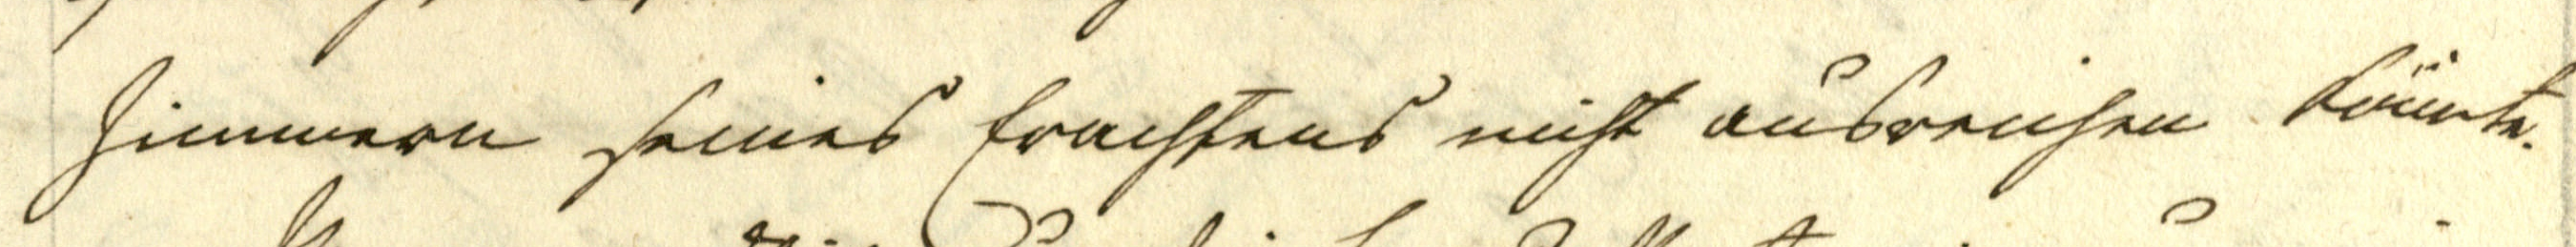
Zimmern seines Erachtens nicht ausreichen könnte.
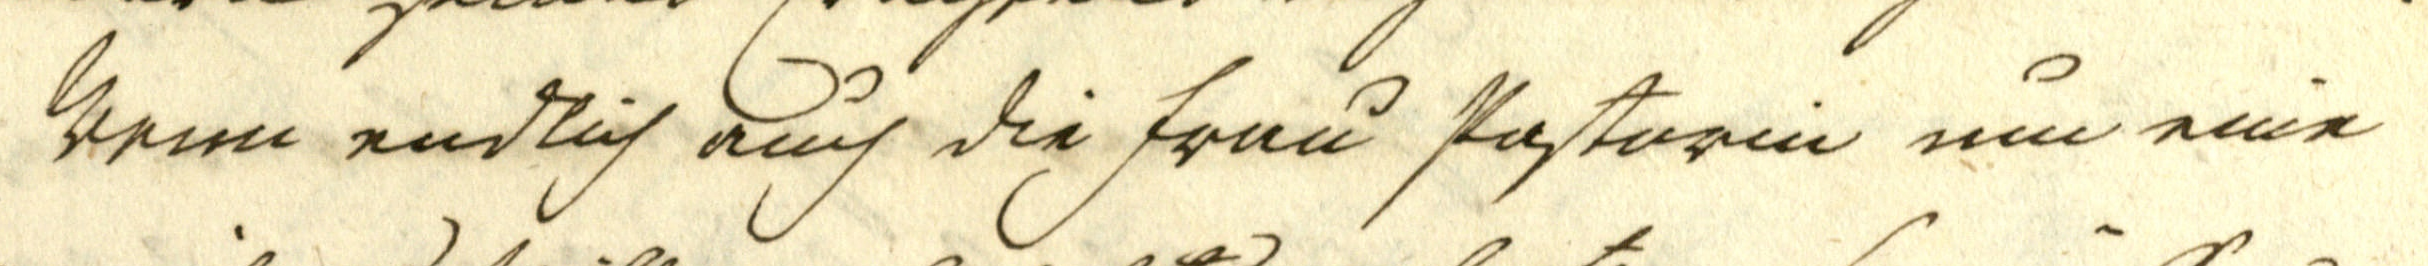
Wenn endlich auch die Frau Pastorin um eine
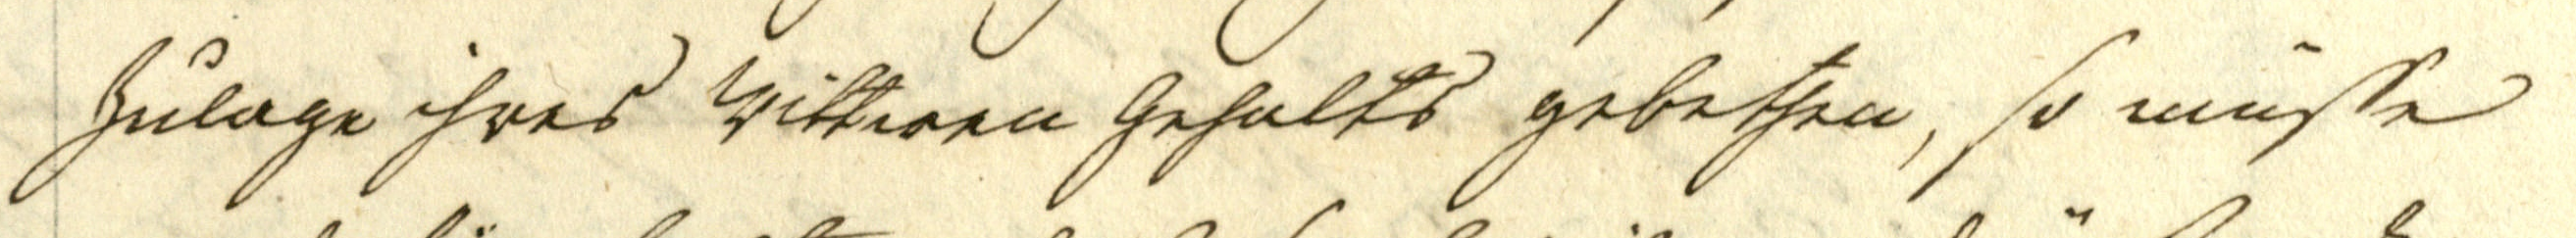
Zulage ihres Wittwren Gehalts gebethen, so müsse
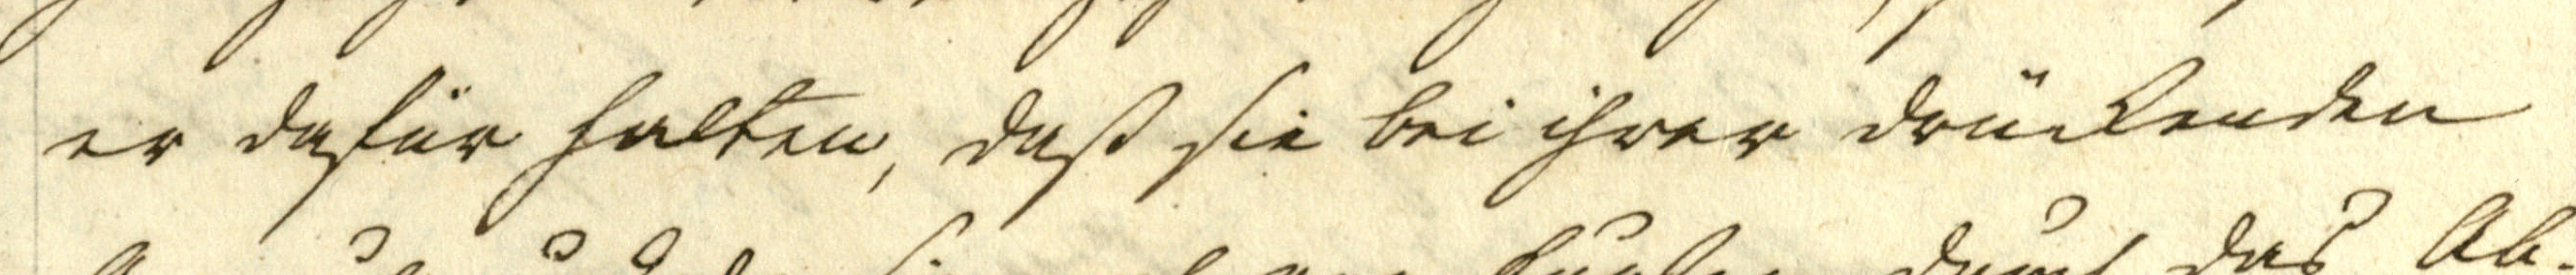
er dafür halten, daß sie bei ihrer drückenden
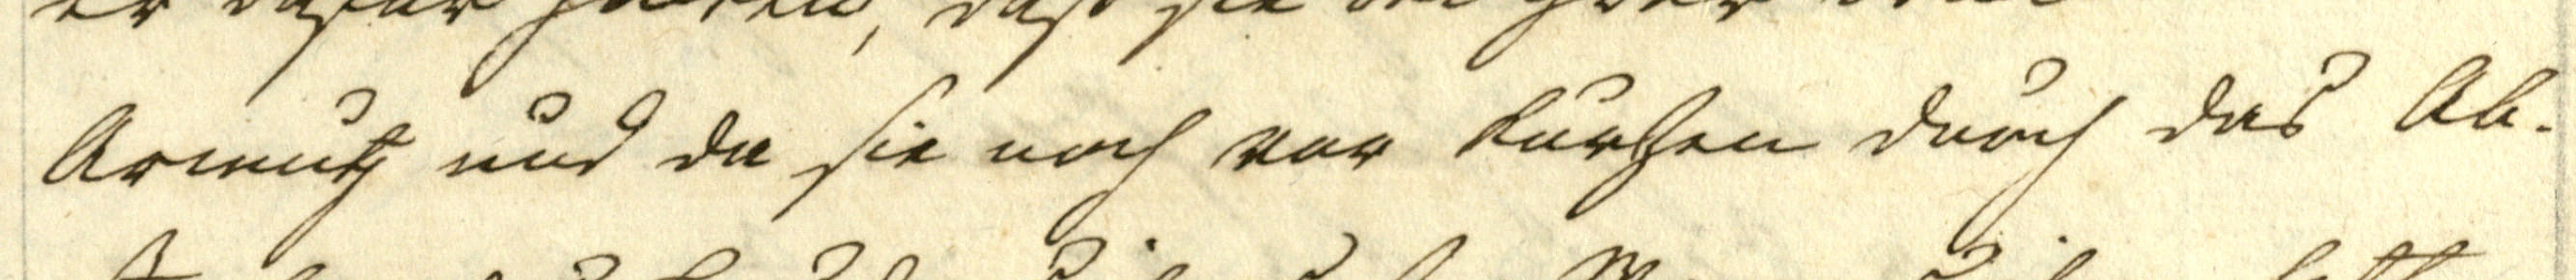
Armuth und da sie noch vor kurzen durch das Ab¬
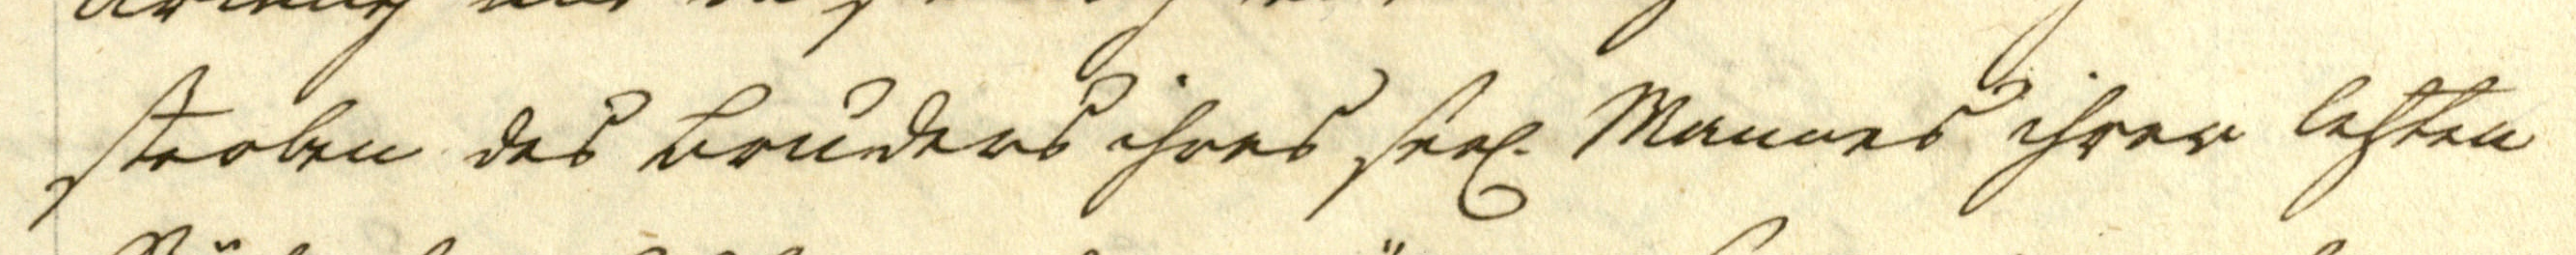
sterben des Bruders ihres seel. Manes ihrer letzten
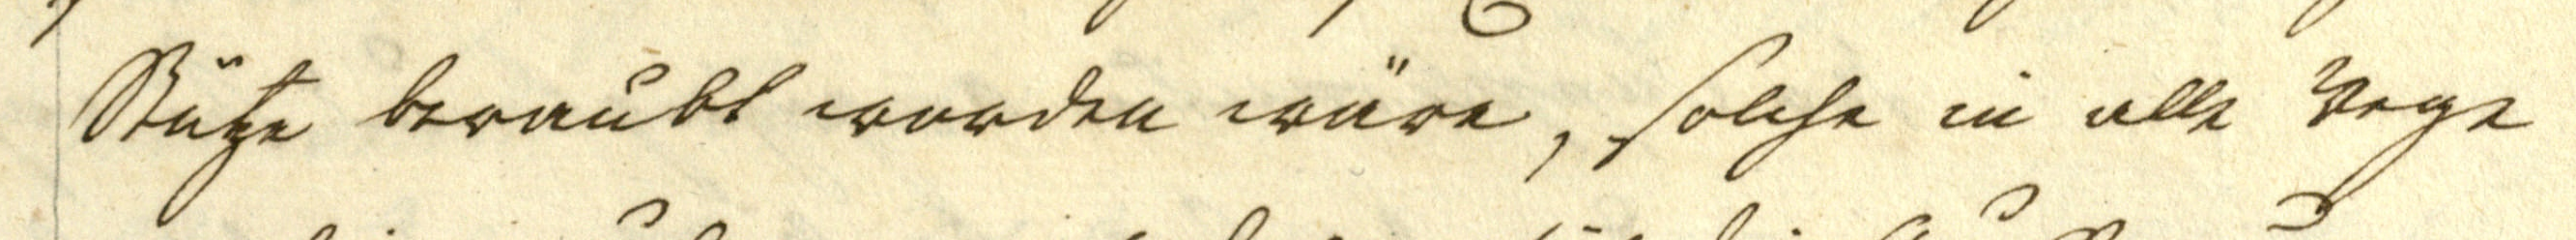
Stütze beraubt worden wäre, solche in alle Wege
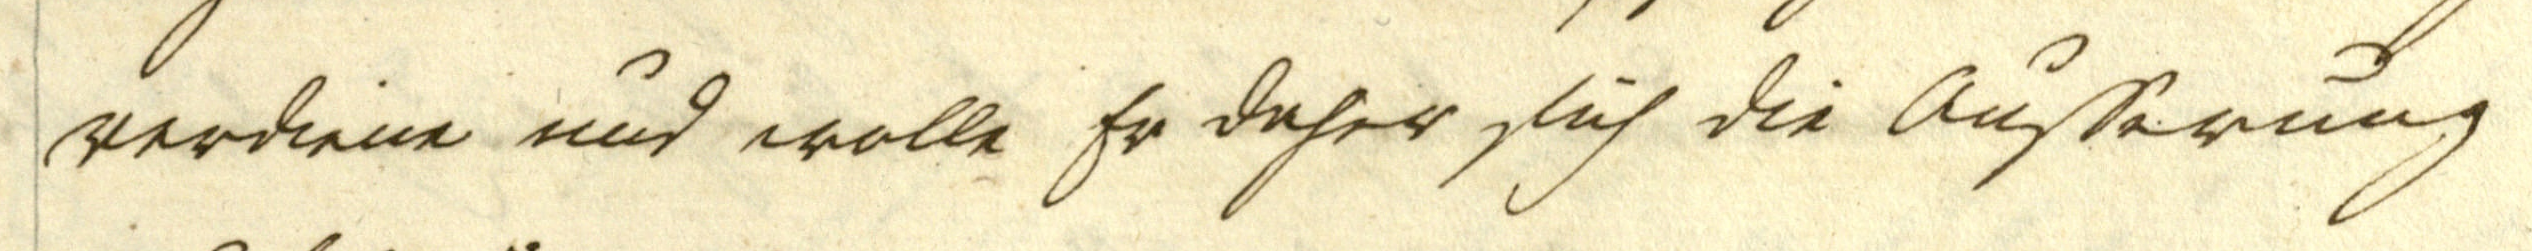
verdiene und wolle Er daher sich die Äusserung
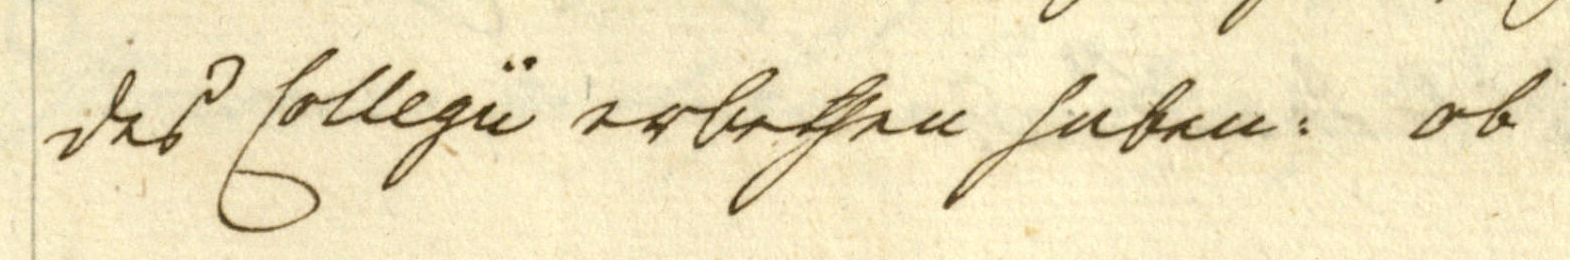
des Collegii erbethen haben: ob
